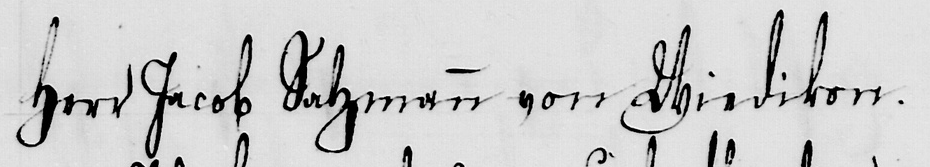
Herr Jacob Salzmann von Wiedikon.
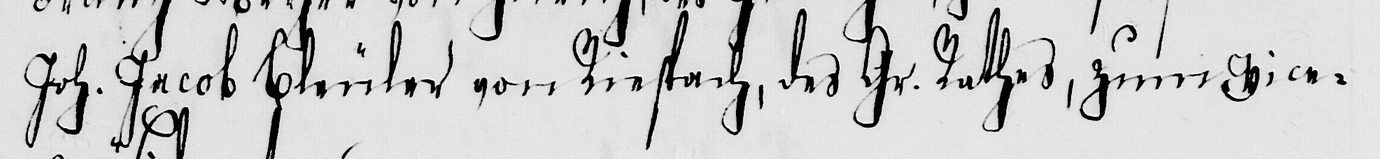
Joh. Jacob Bleuler von Riespach, des Gr. Rathes, zum Vice¬
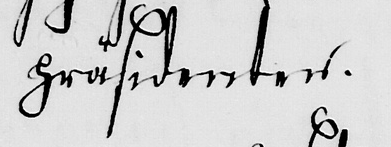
präsidenten.
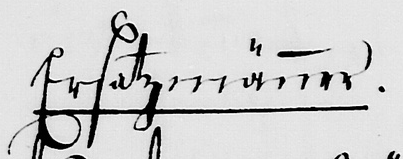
Ersatzmänner.
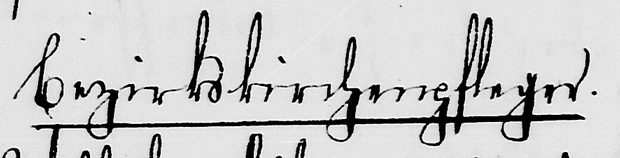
Bezirkskirchenpfleger.
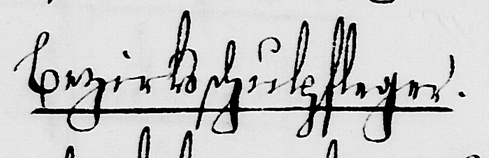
Bezirksschulpfleger.
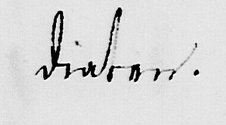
diaten.
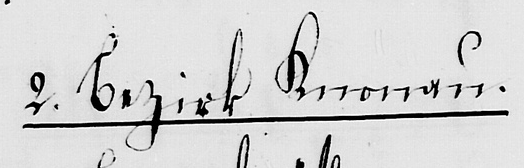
2. Bezirk Knonau.
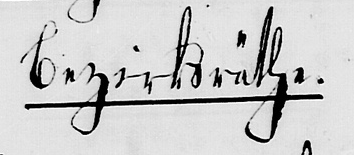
Bezirksräthe.
